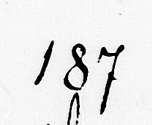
2.)
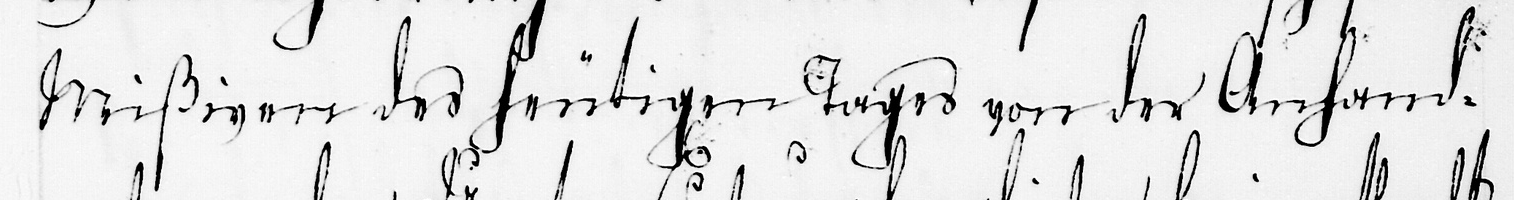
Mißiven des heutigen Tages von der Anhand¬
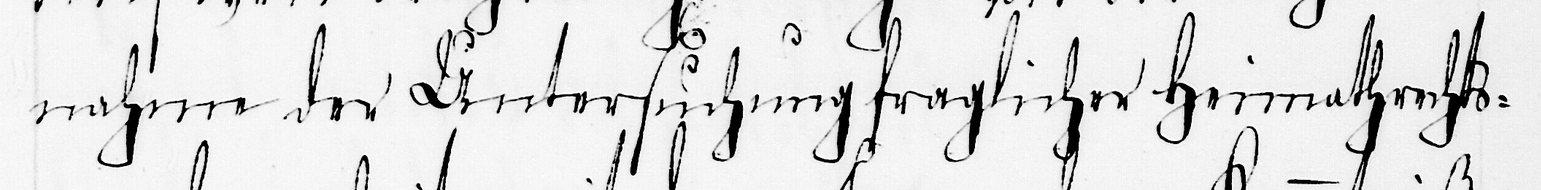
nahme der Untersuchung fraglicher Heimathrechts¬
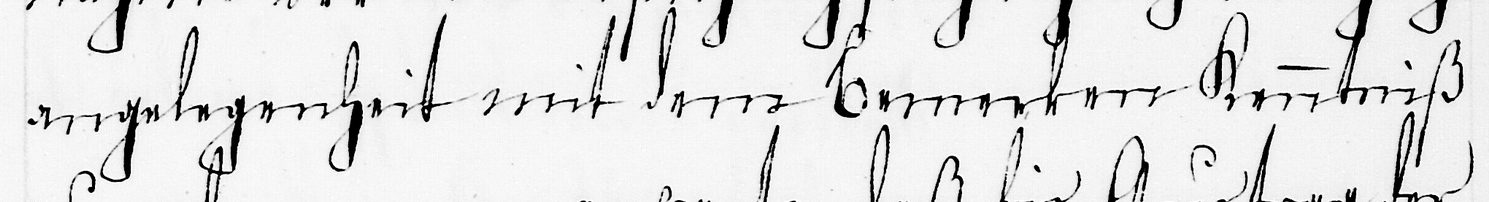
angelegenheit mit dem Bemerken Kenntniß
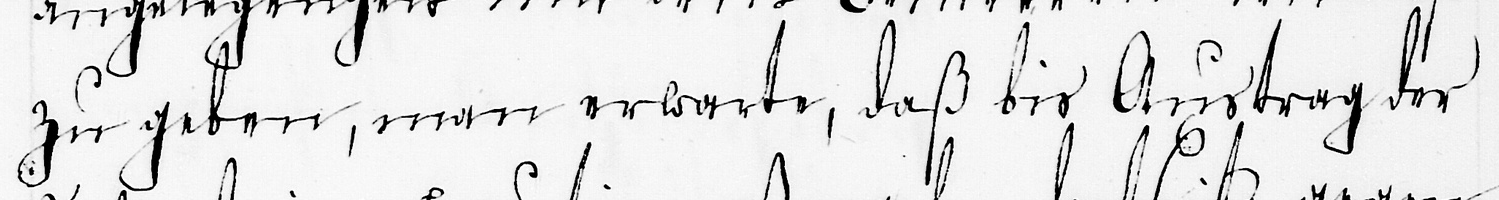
zu geben, man erwarte, daß bis Austrag der
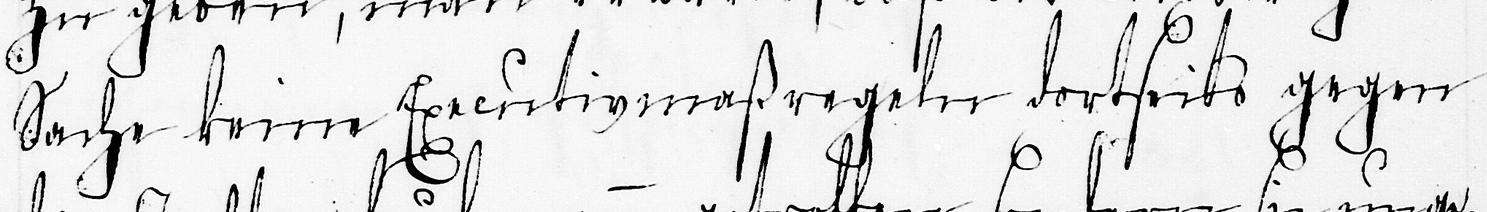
Sache keine Executivmaßregeln dortseits gegen
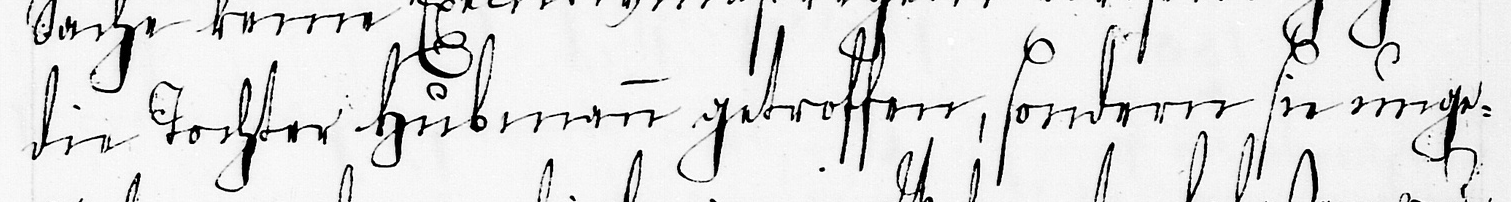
die Tochter Hubmann getroffen, sondern sie unge¬
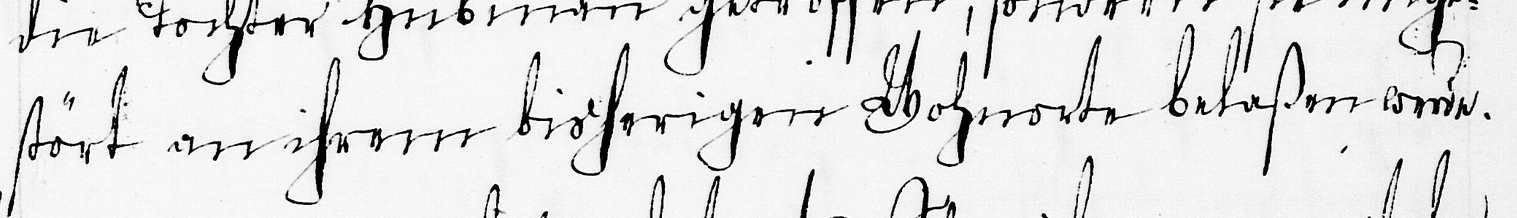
stört an ihrem bisherigen Wohnorte belaßen werde.
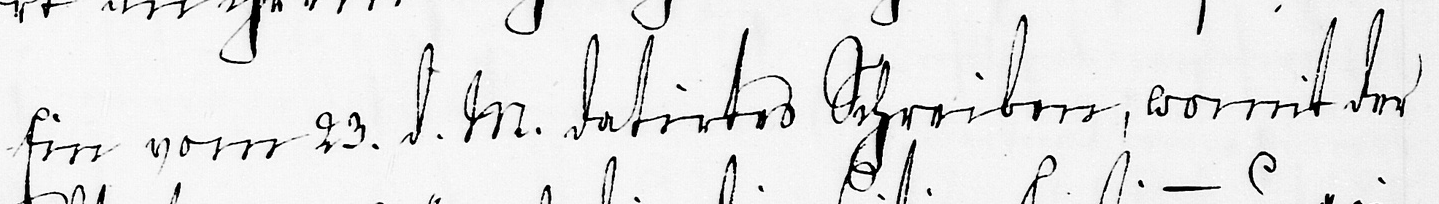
Ein vom 23. d. M. datirtes Schreiben, womit der
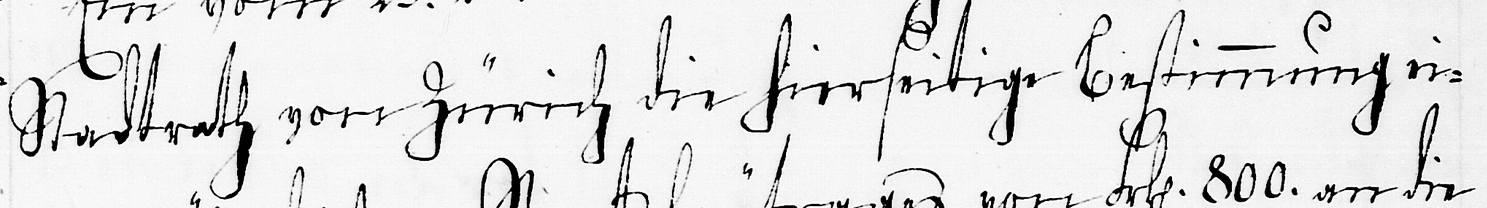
Stadtrath von Zürich die hierseitige Bestimmung ei¬
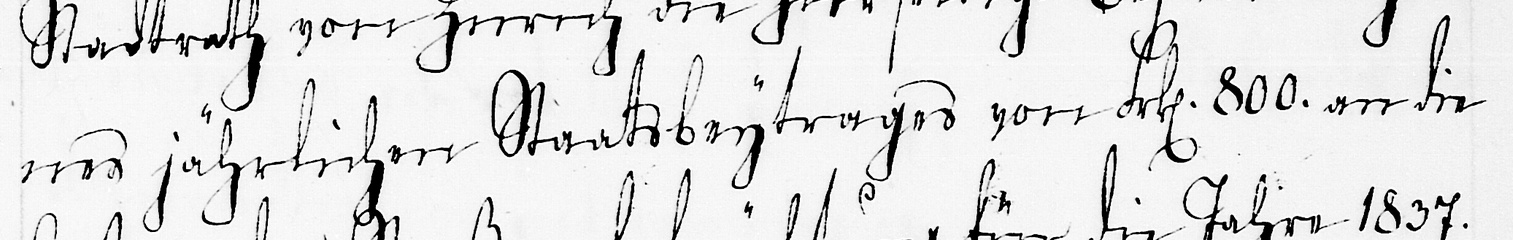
nes jährlichen Staatsbeytrages von Frk[en]. 800. an die
